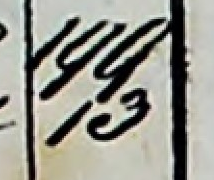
1993
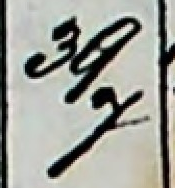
397
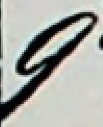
9
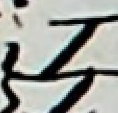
I
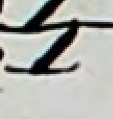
I
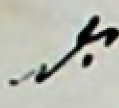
do
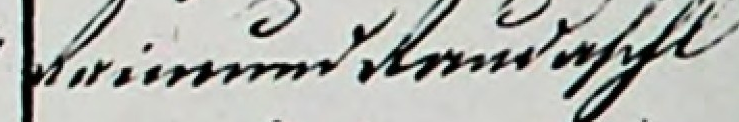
Reimund Raudaschl
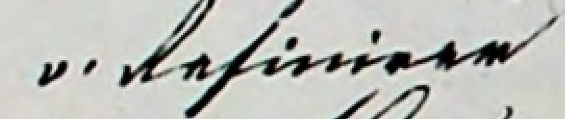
v. Rasinirer
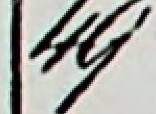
49
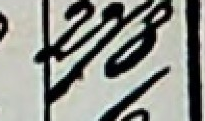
278
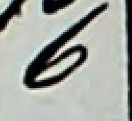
6
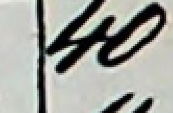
40
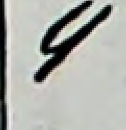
9
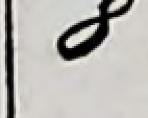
8
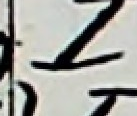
I
